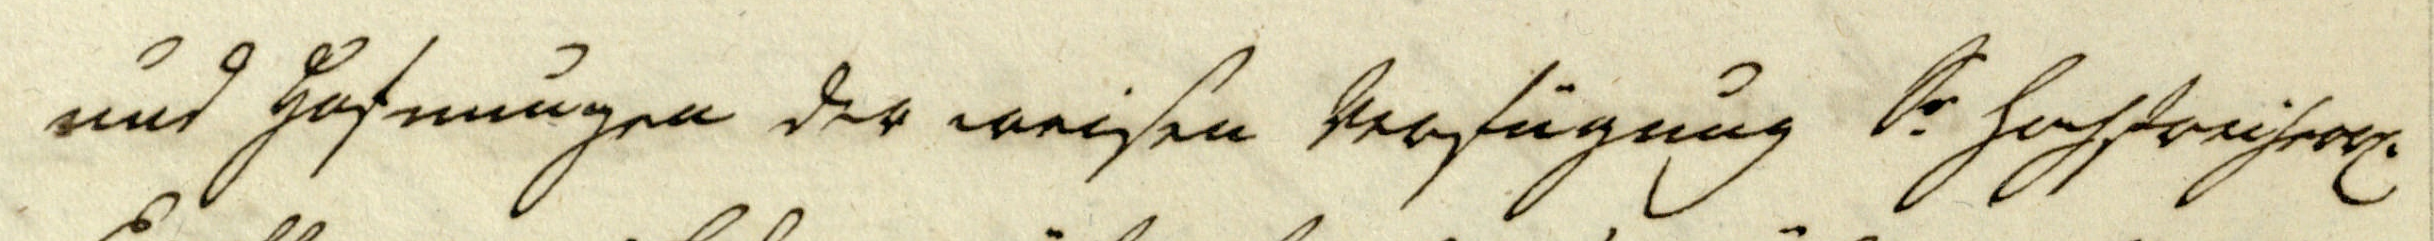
und Hofnungen der weisen Verfügung Sr. hochfreiherrl.
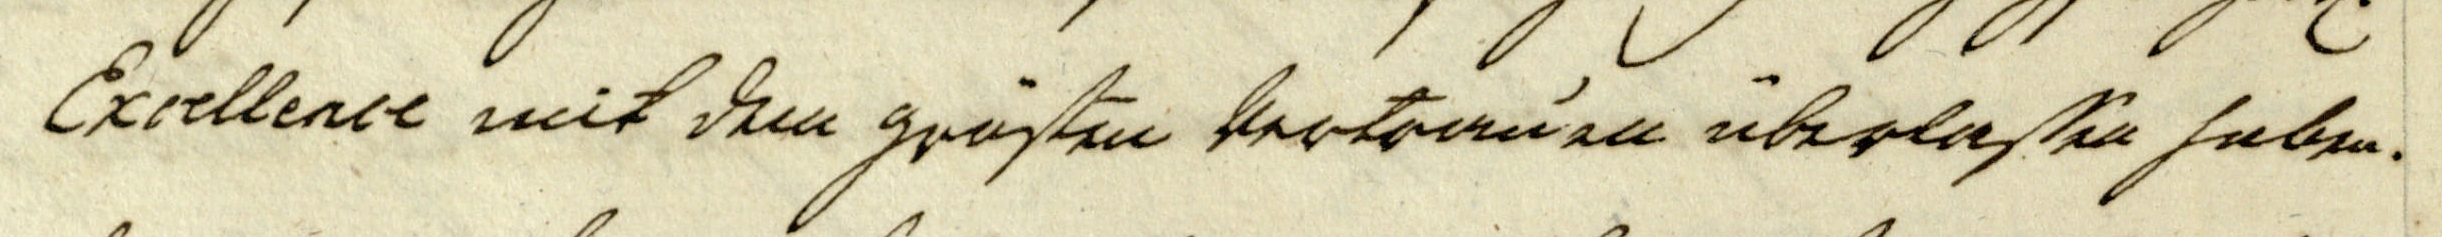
Excellence mit dem grösten Vertrauen überlassen haben.
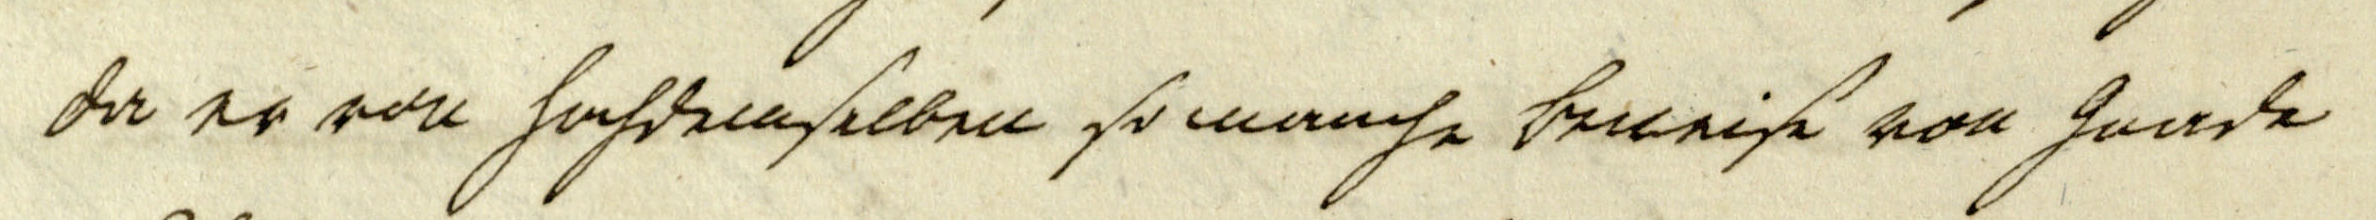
da er von Hochdemselben so manche Beweise von Gnade
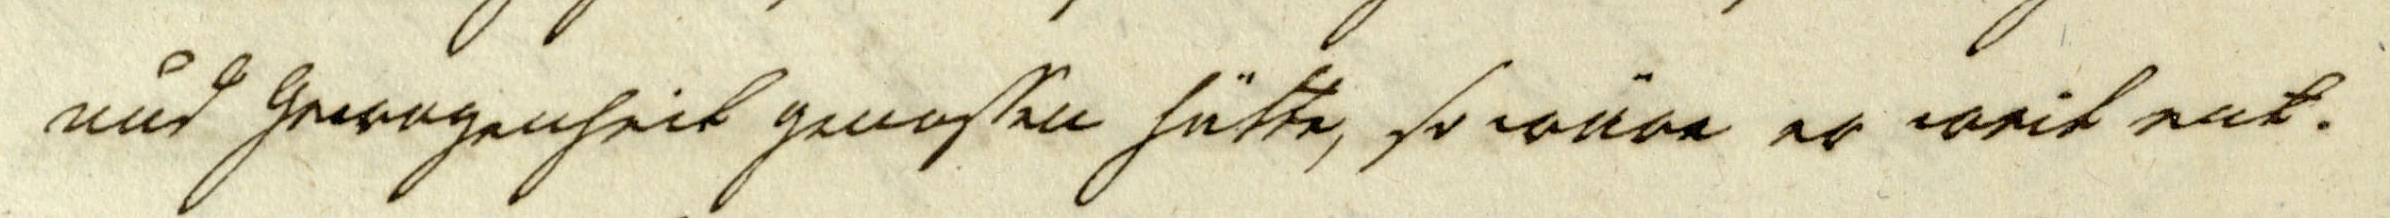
und Gewogenheit genossen hätte, so wäre er weit ent¬
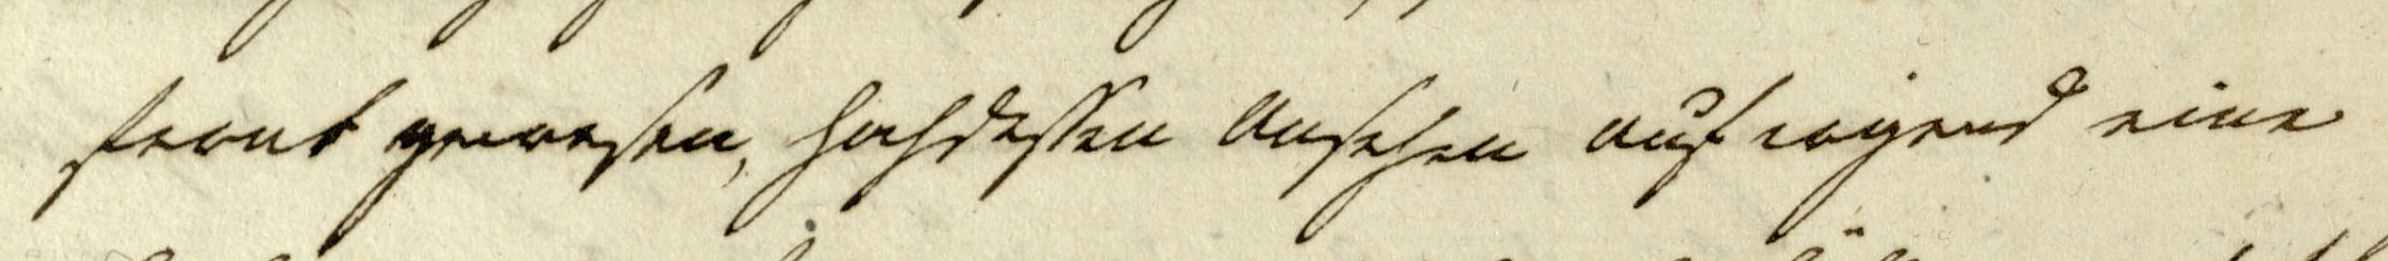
fernt gewesen, hochdessen Ansehen auf irgend eine
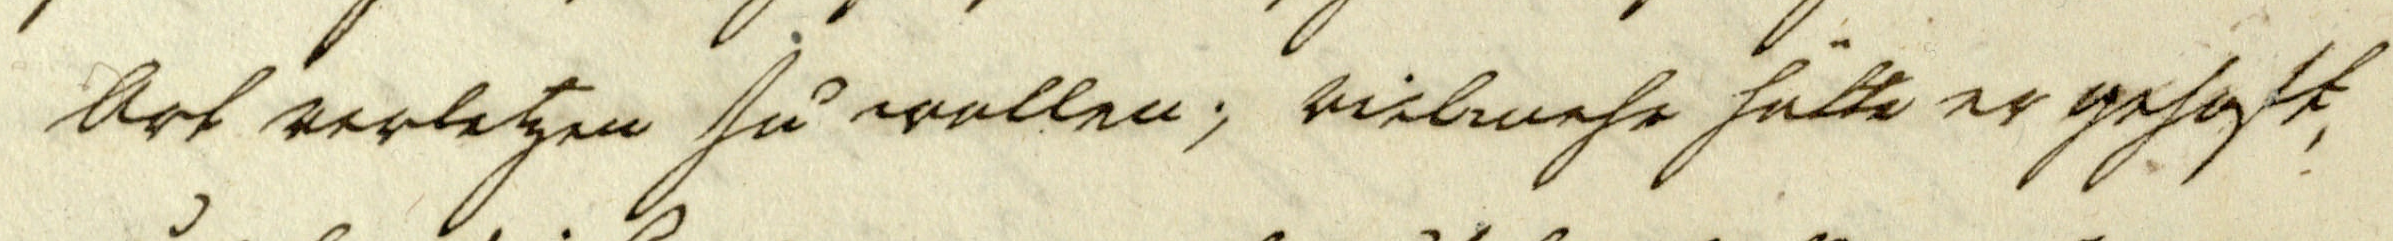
Art verletzen zu wollen; vielmehr hätte er gehoft,
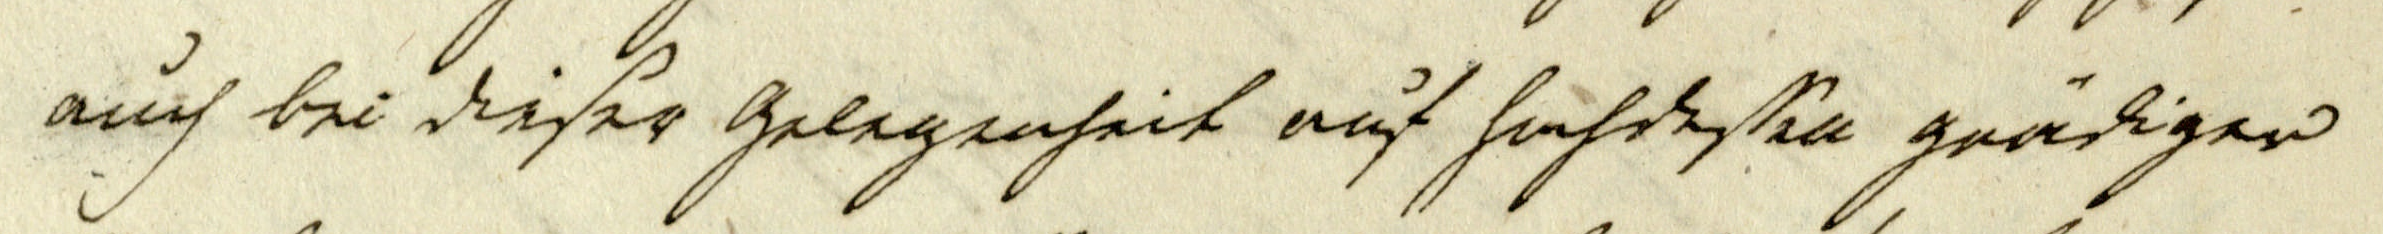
auch bei dieser Gelegenheit auf hochdessen gnädiger
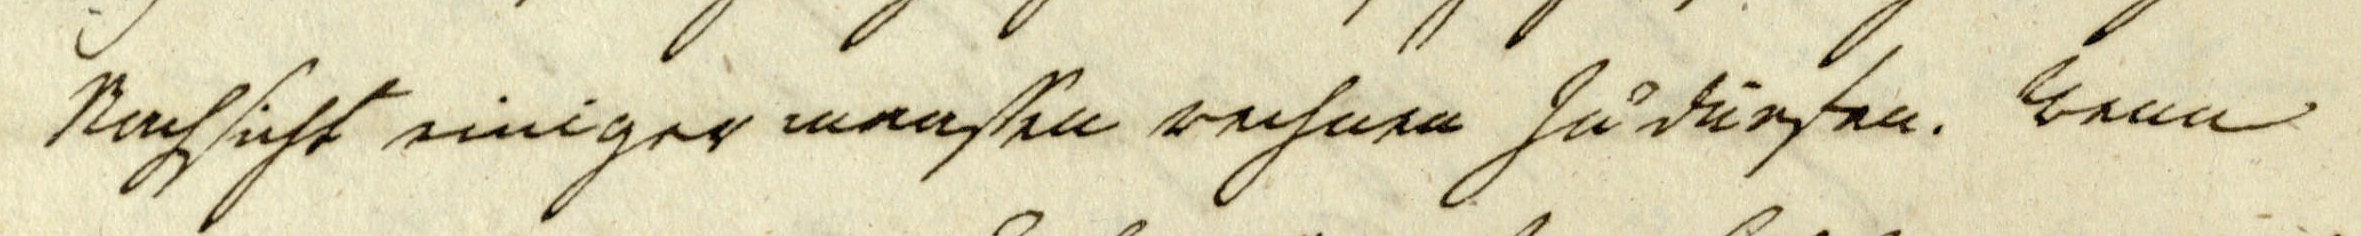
Nachsicht einiger maassen rechnen zu dürfen. Wenn
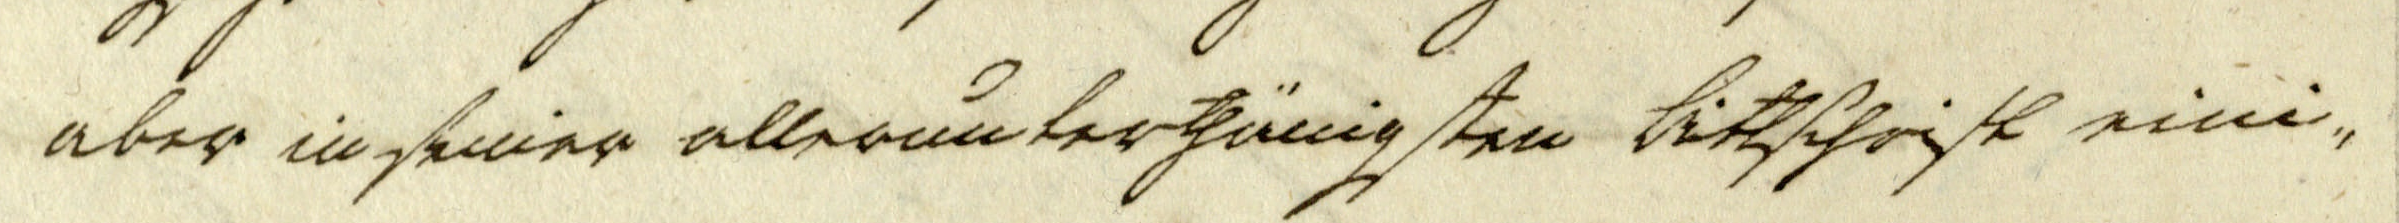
aber in seiner allerunterthänigsten Bittschrift eini¬
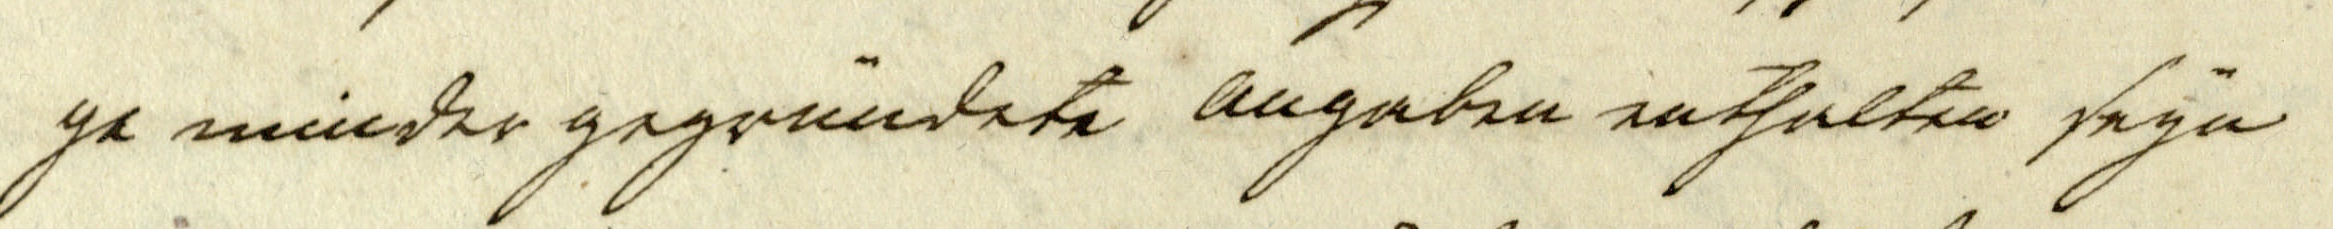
ge minder gegründete Angaben enthalten seÿn
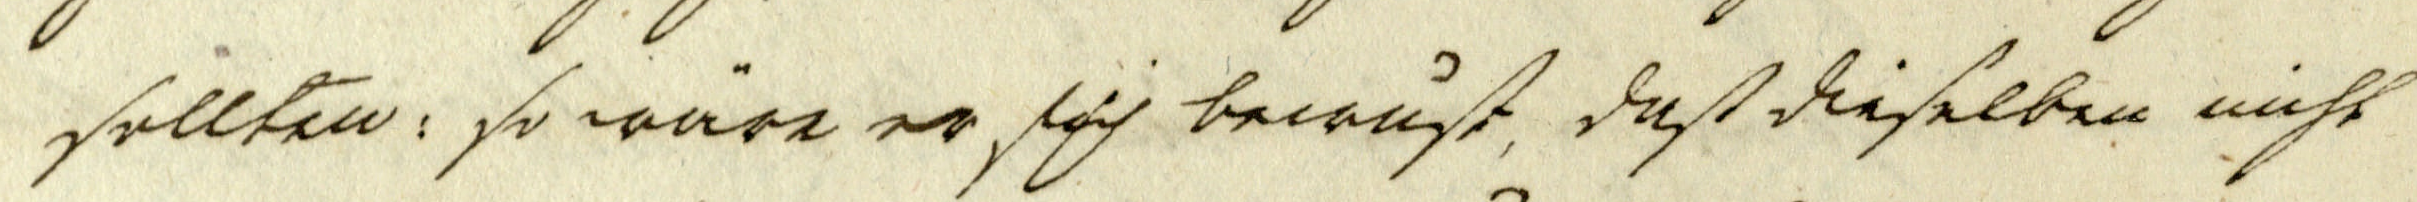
sollten, so wäre er sich bewust, daß dieselben nicht
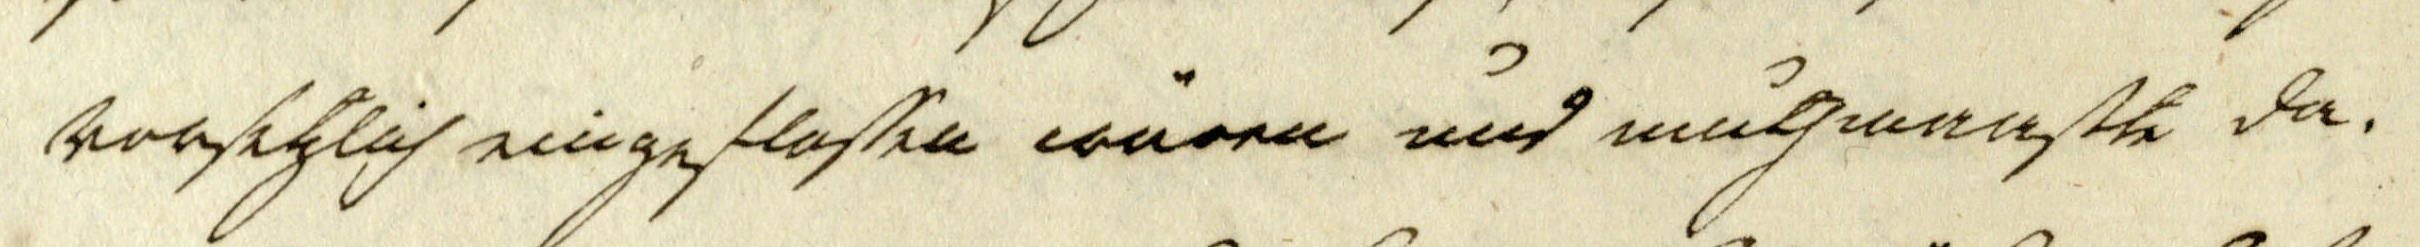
vosetzlich eingeschlossen wären und muthmaaste da¬
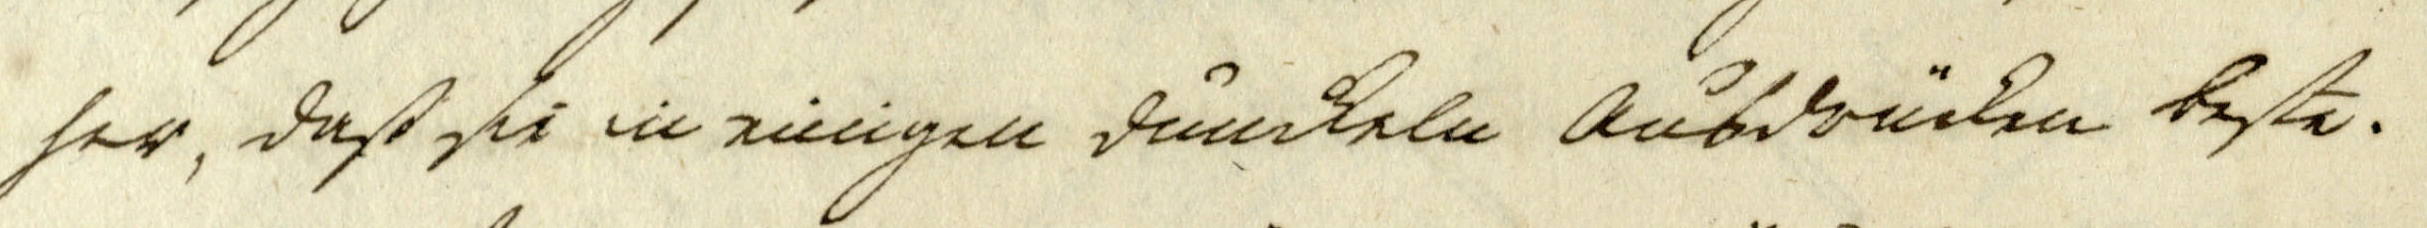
her, daß sie in einigen dunckeln Ausdrücken beste¬
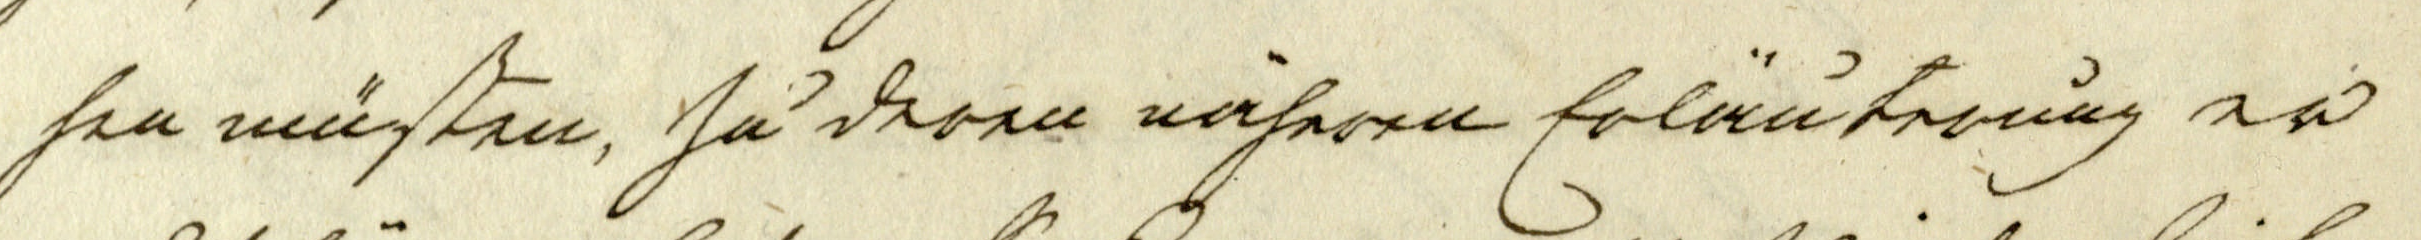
hen müsten, zu deren näheren Erläuterung er
